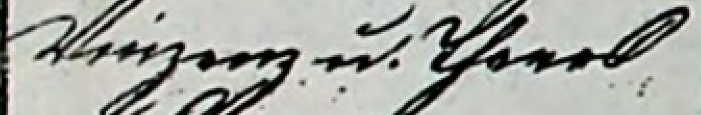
Vinzenz u. Theres
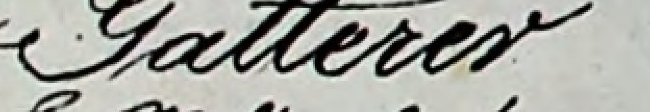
Gatterer
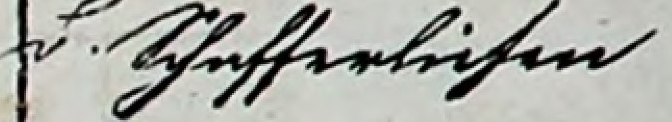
v. Schafferlichen
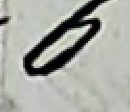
6
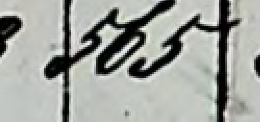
565
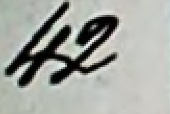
42
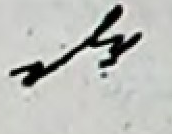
do
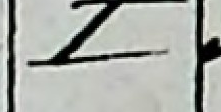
I
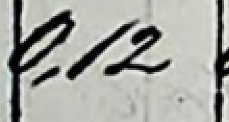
0,12
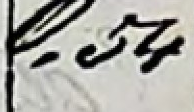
0,54
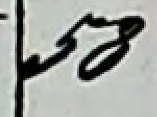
58
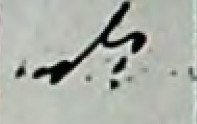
do
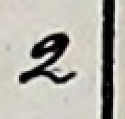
2
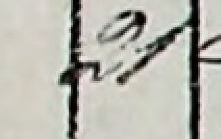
21
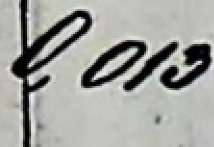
0,013
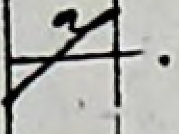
7
